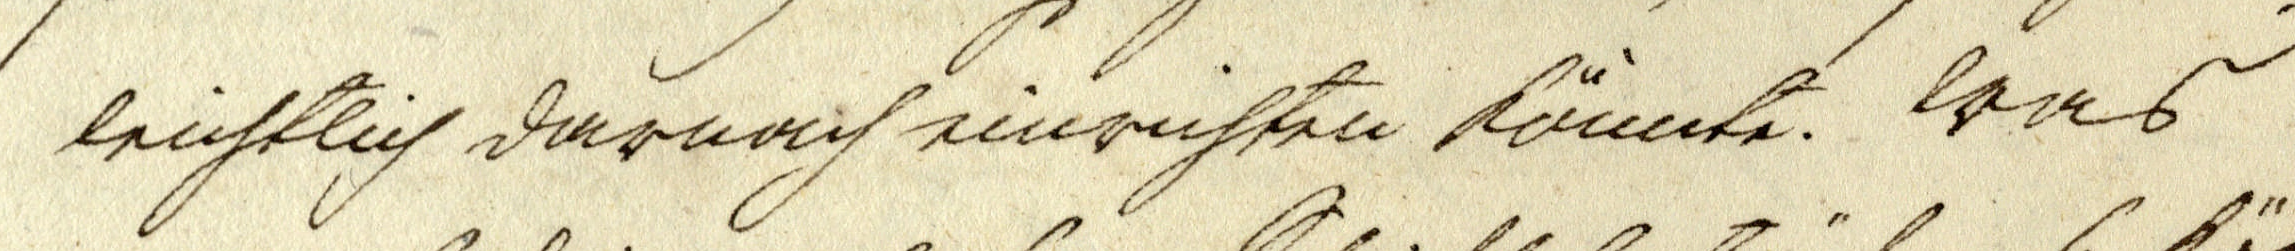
leichtlich darnach einrichten könnte. Was
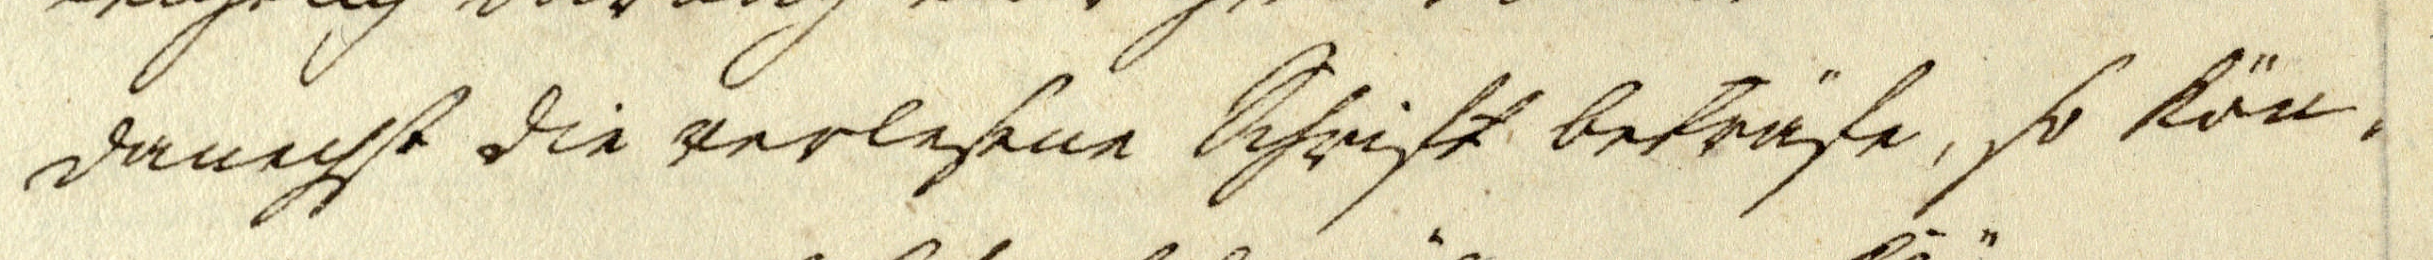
danechst die verlesene Schrift beträfe, so kön¬
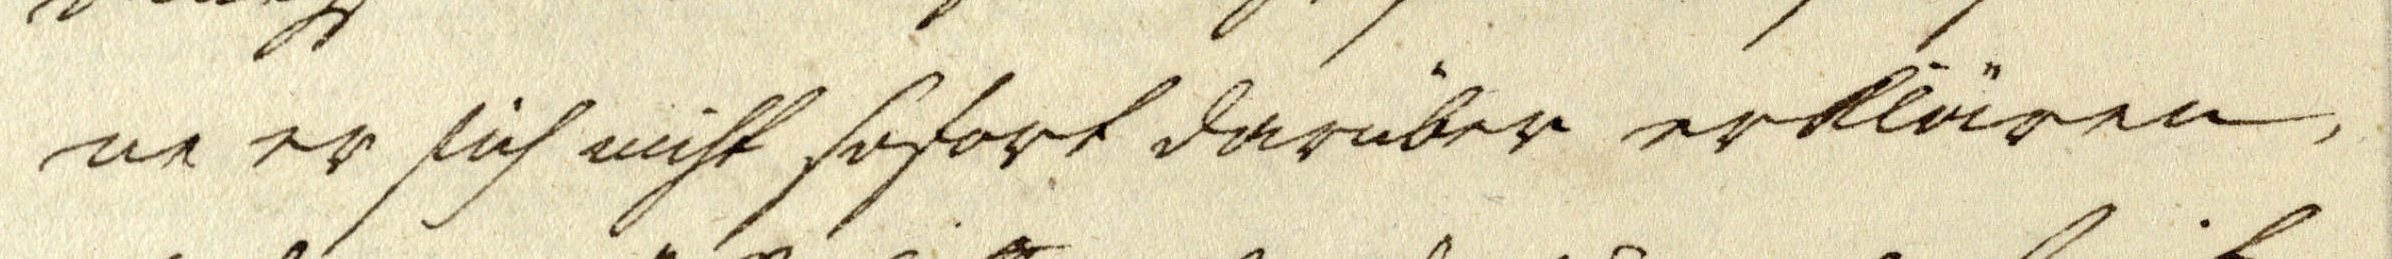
ne er sich nicht sofort darüber erklären,
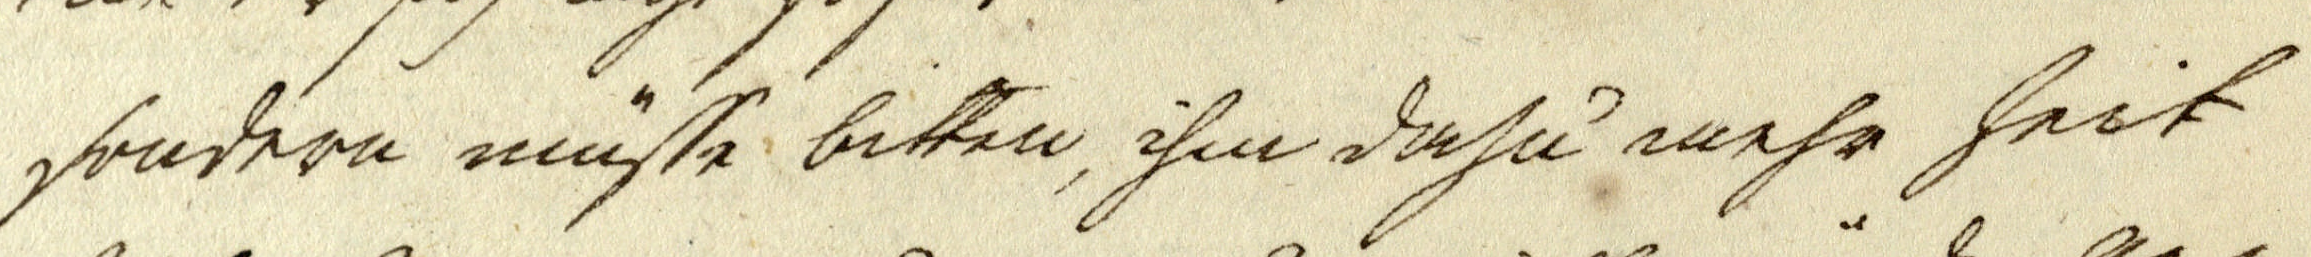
sondern müsse bitten, ihm dazu mehr Zeit
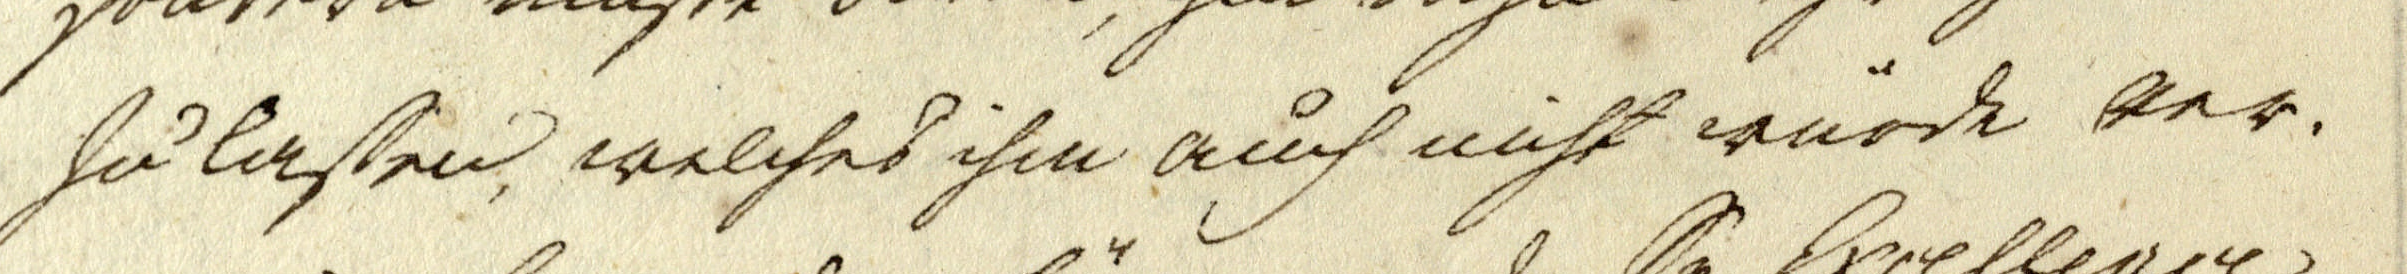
zu lassen, welches ihm auch nicht würde ver¬
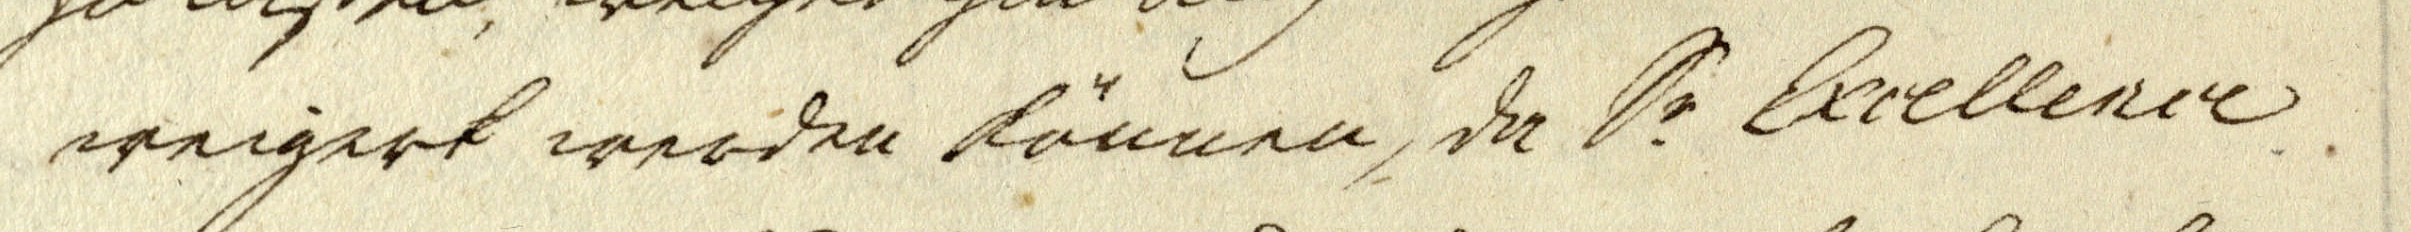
weigert werden können, da Sr Excellence
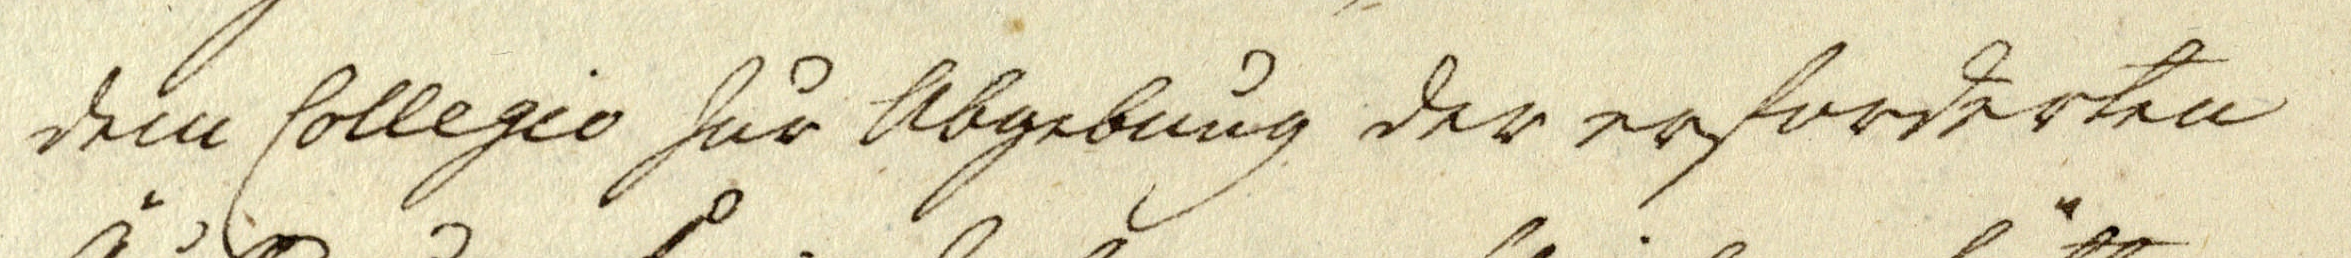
dem Collegio zur Abgebung der erforderten
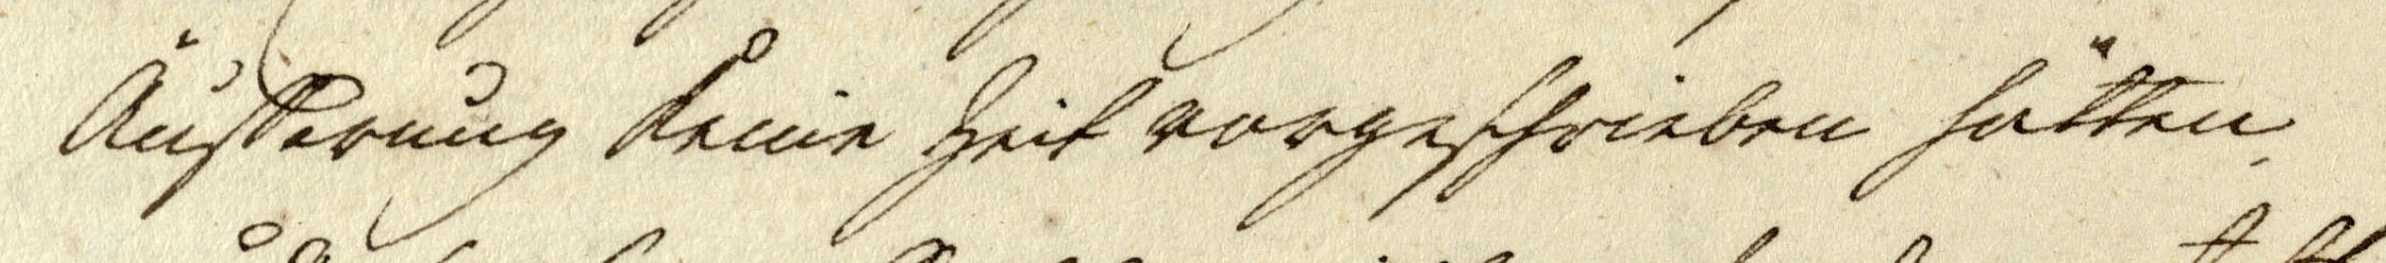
Äusserung keine Zeit vorgeschrieben hätten
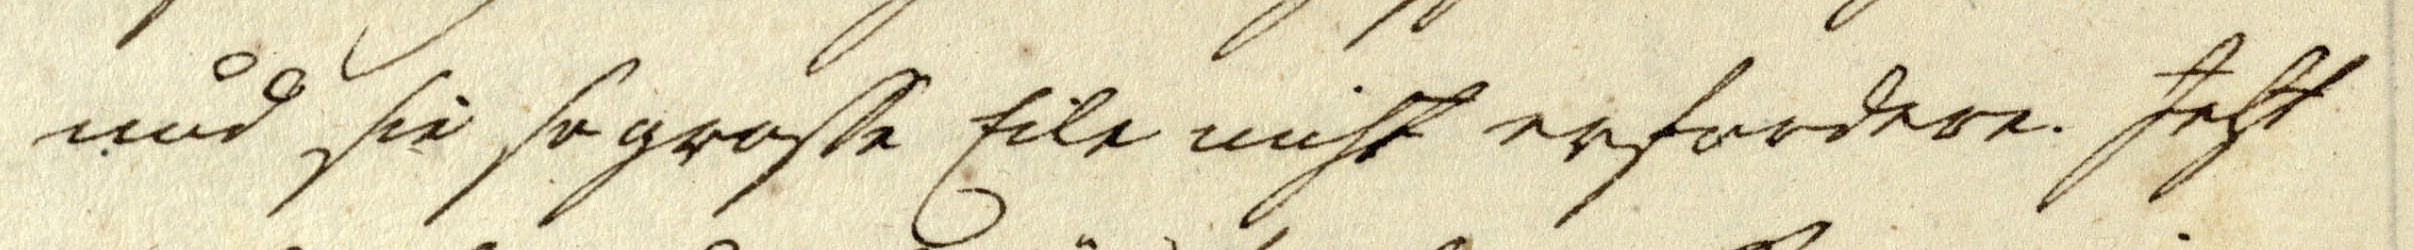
und sie so grosse Eile nicht erfordere. Jetzt
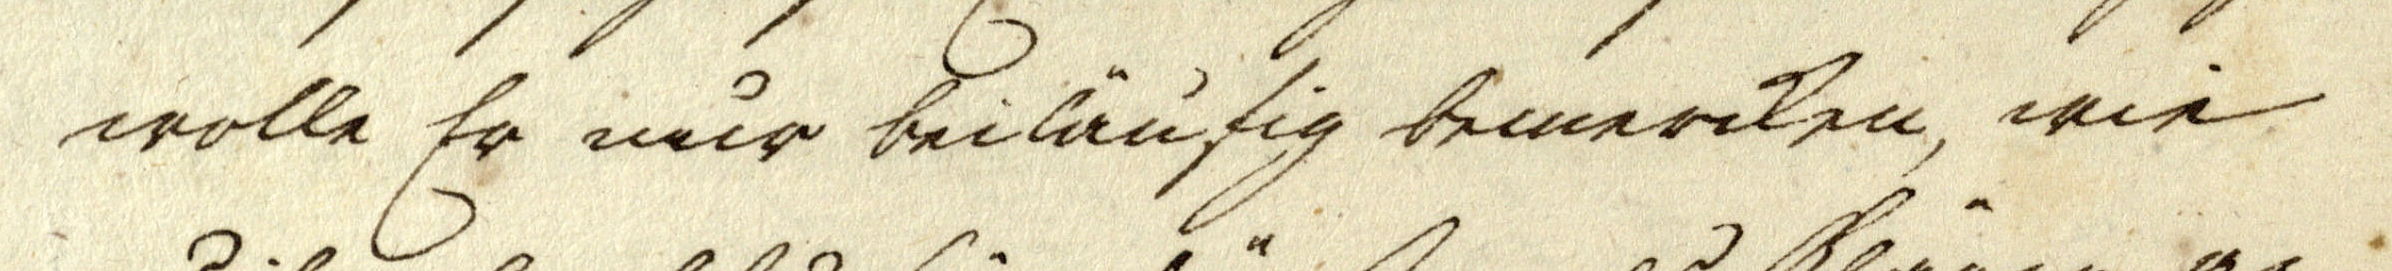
wolle Er er nur beiläufig bemercken, wie
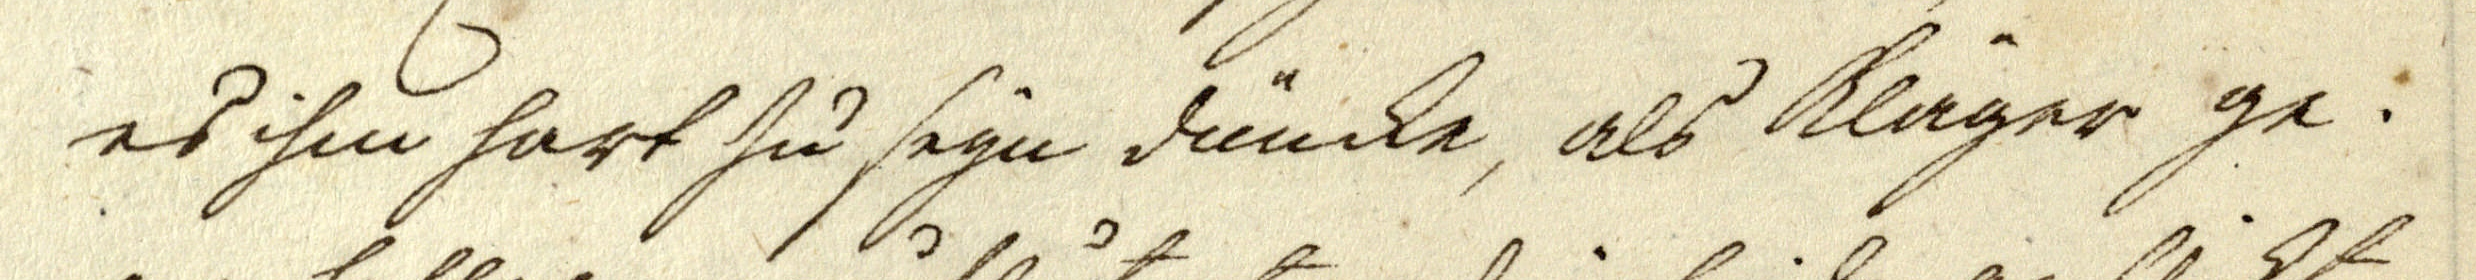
es ihm hart zu seÿn düncke, als Kläger ge¬
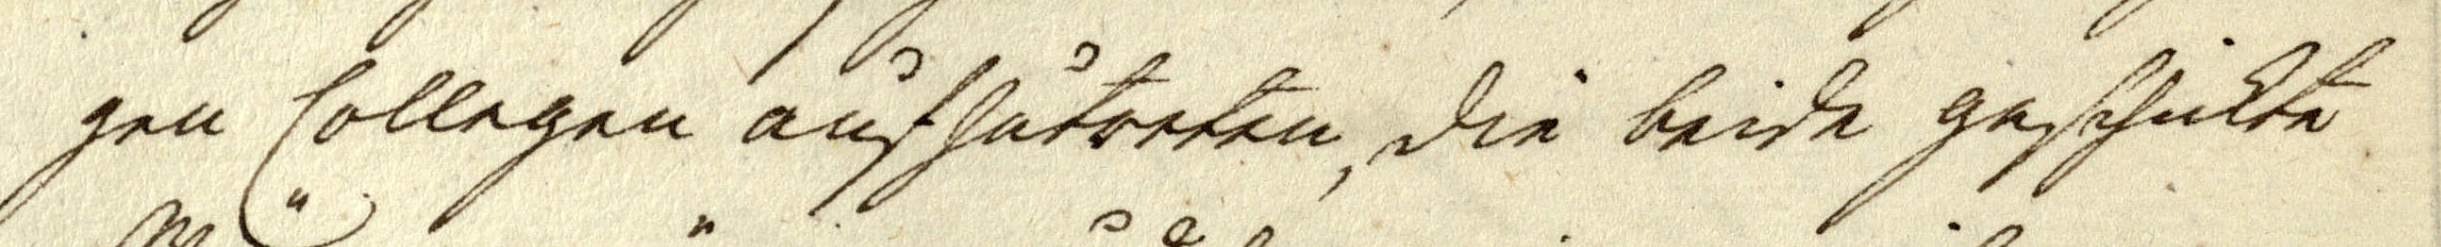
gen Collegen aufzutreten, die beide geschickte
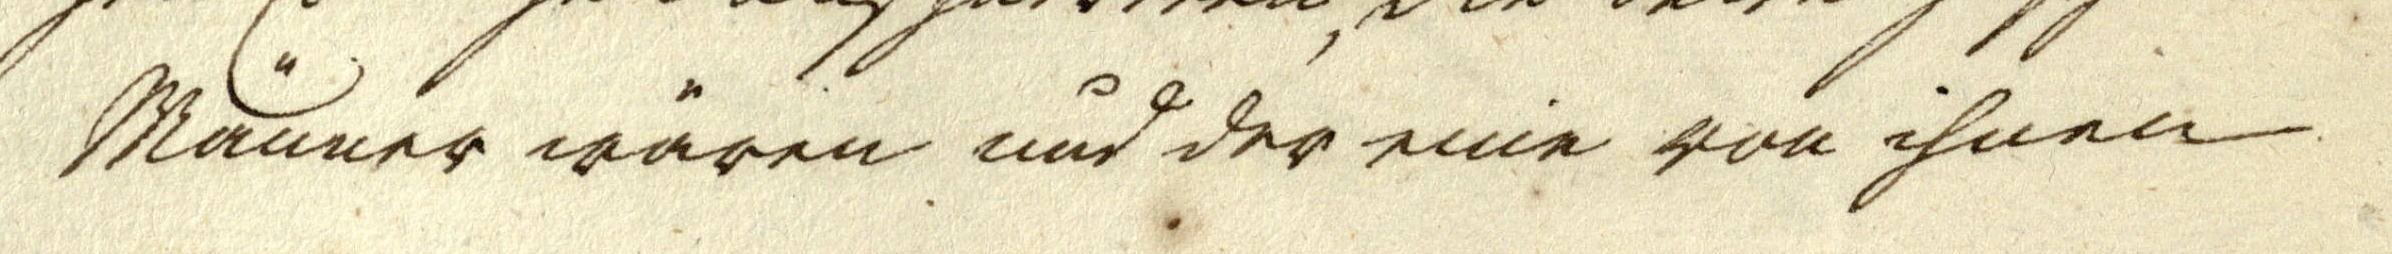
Männer wären und der eine von ihnen
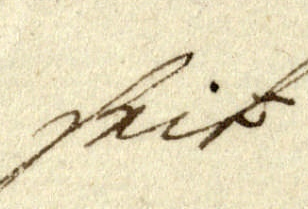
seit
